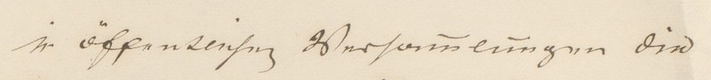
in öffentlichen Versammlungen die
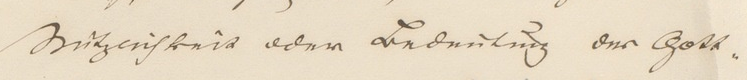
Nützlichkeit oder Bedeutung der Gott-
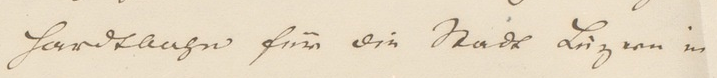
hardtbahn für die Stadt Luzern in
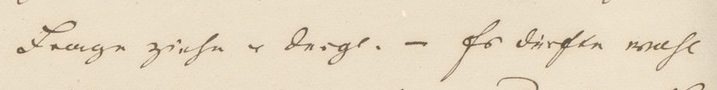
Frage ziehe & dergl. – Es dürfte wohl
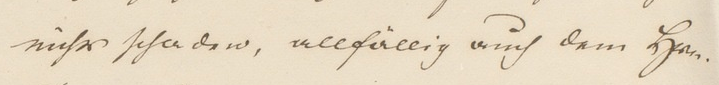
nichts schaden, allfällig auch dem Hrn.
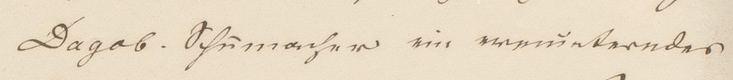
Dagob. Schumacher ein ermunterndes
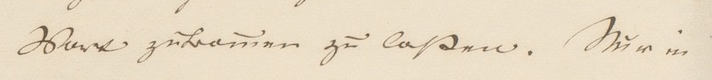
Wort zukommen zu laßen. Nur in
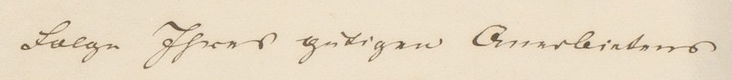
Folge Ihres gütigen Anerbietens
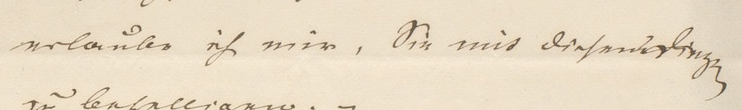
erlaube ich mir, Sie mit diesen Dingen
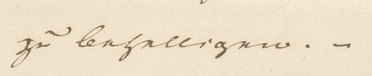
zu behelligen. –
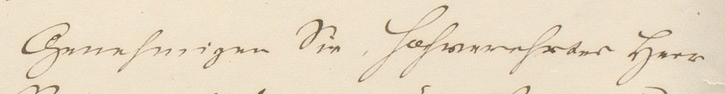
Genehmigen Sie, hochverehrter Herr
